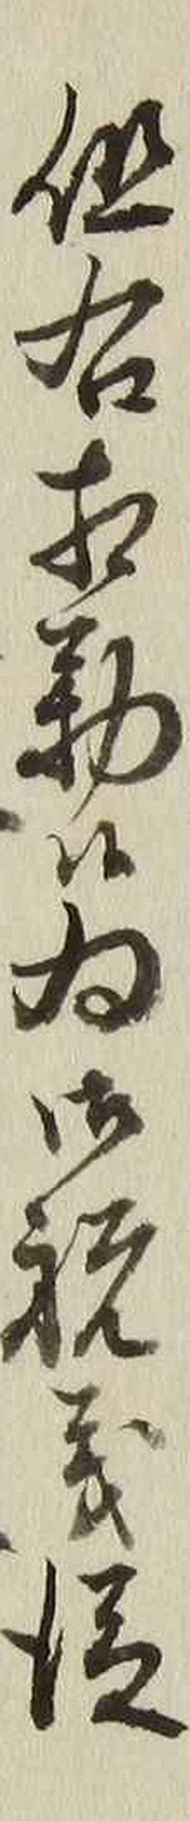但右相勤候為御祝義従
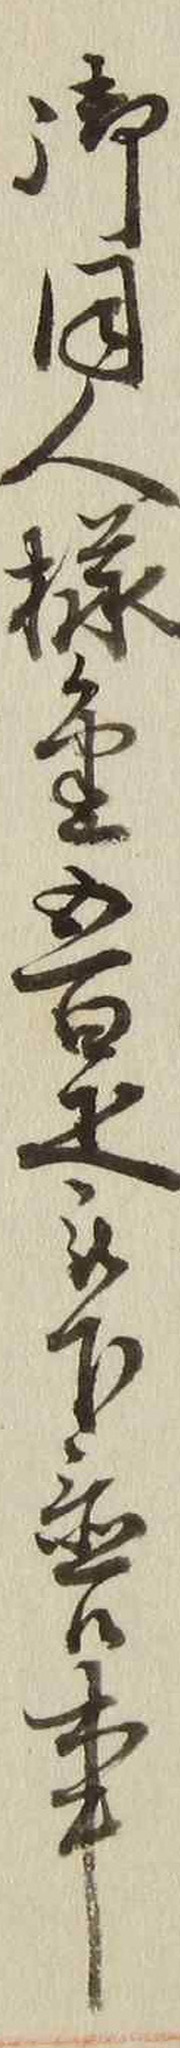御同人様金五百疋被下置候事
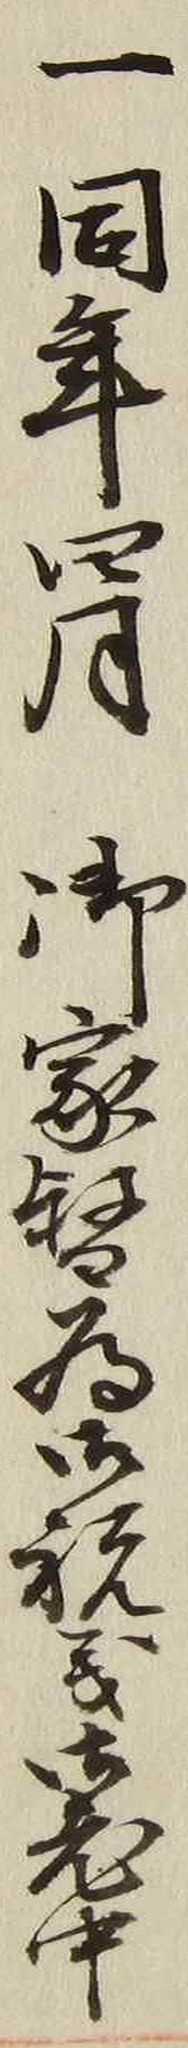一同年四月御家督為御祝義御老中
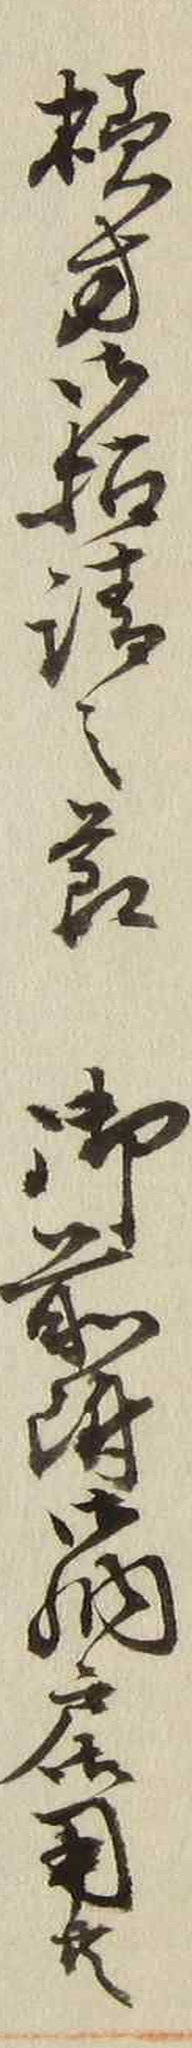様方御招請之節御前附御納戸御用共
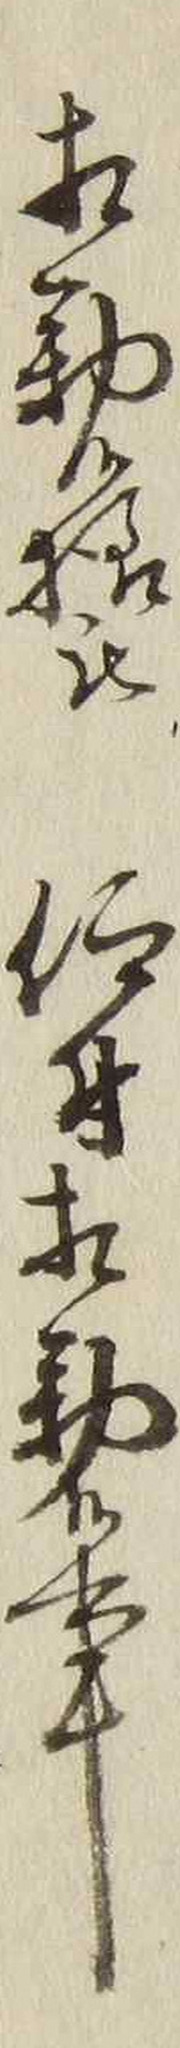相勤候様被仰付相勤候事
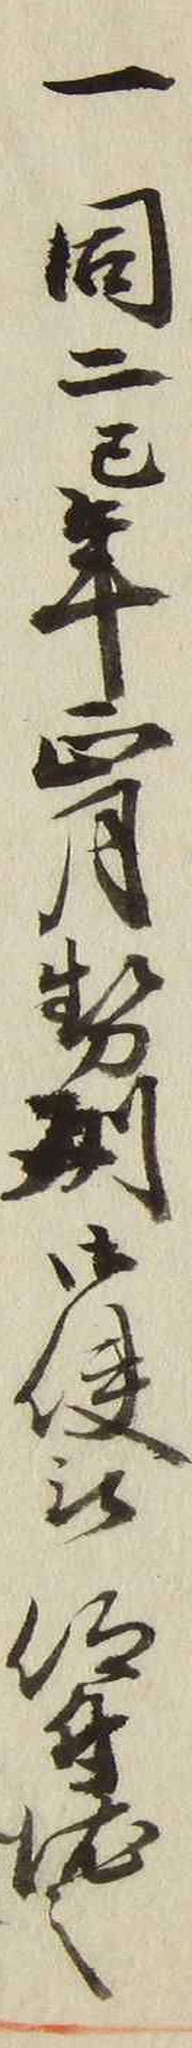一同二巳年正月勢州御使被仰付依之
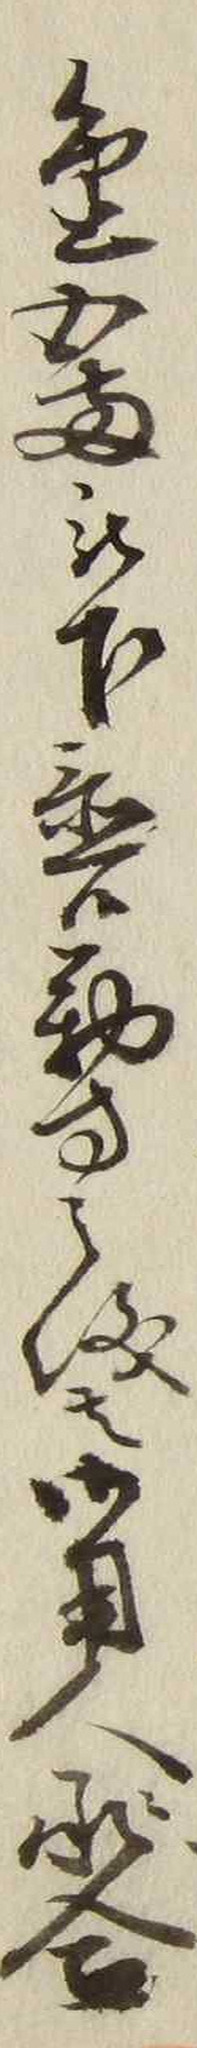金五両被下置候勤方之儀者御用人ニ承合

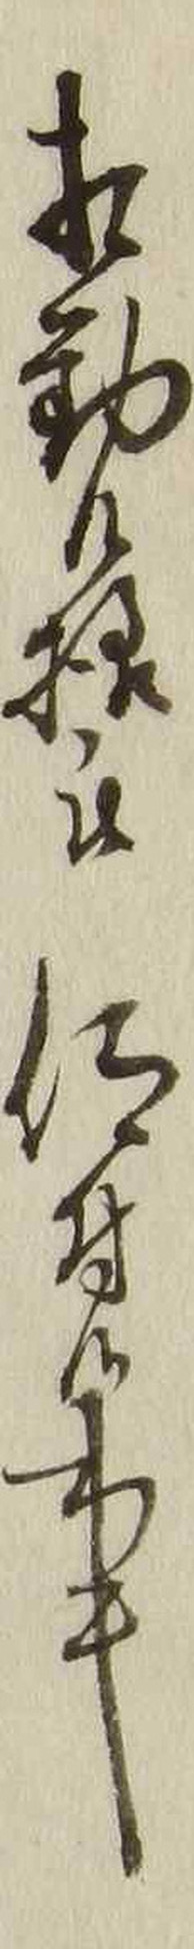相勤候様被仰付候事
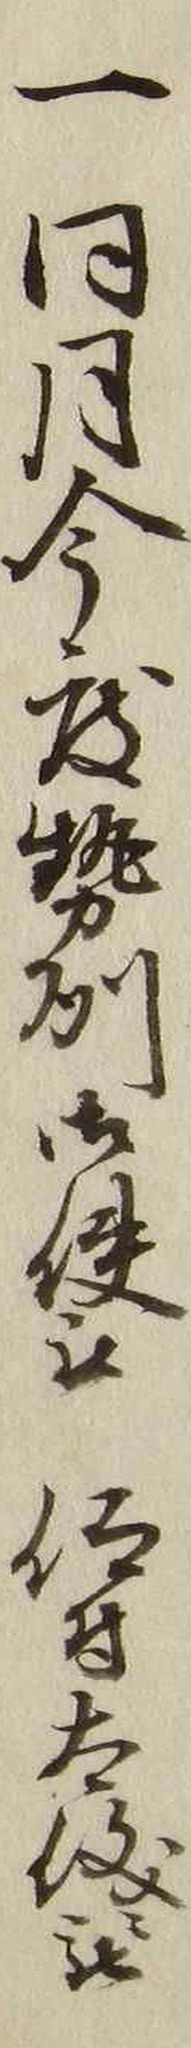一同月今度勢州御使被仰付太儀ニ被
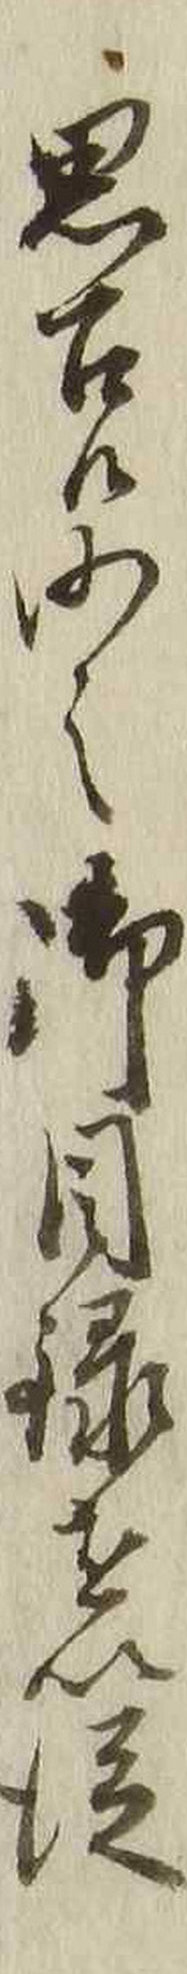思召候仍之御目録を以従
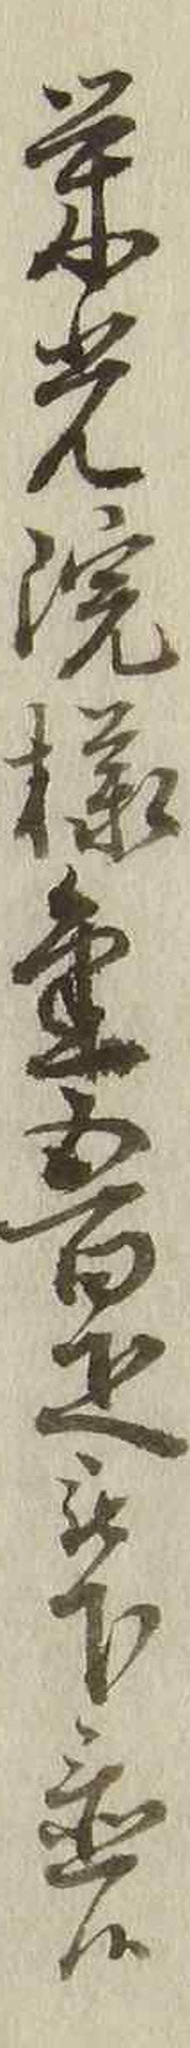栄光院様金五百疋被下置候
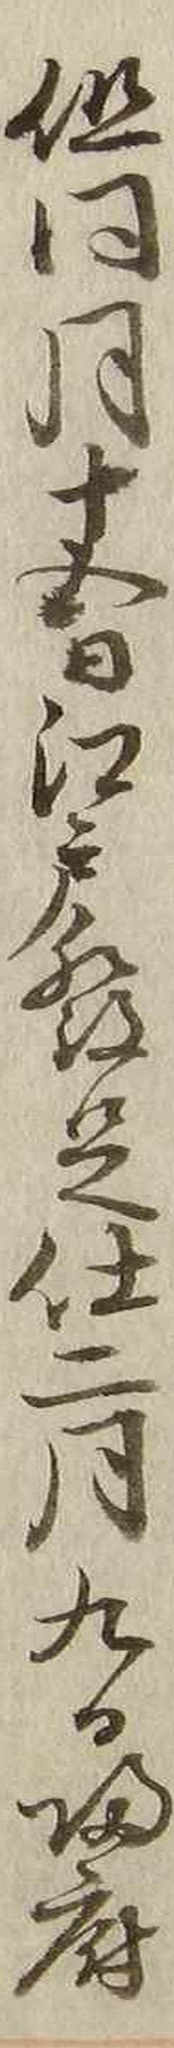但同月十五日江戸発足仕二月九日帰府
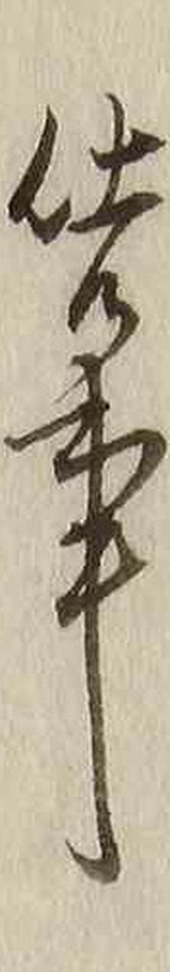仕候事
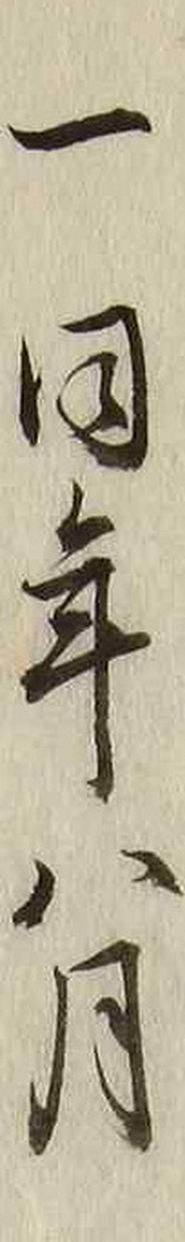一同年八月
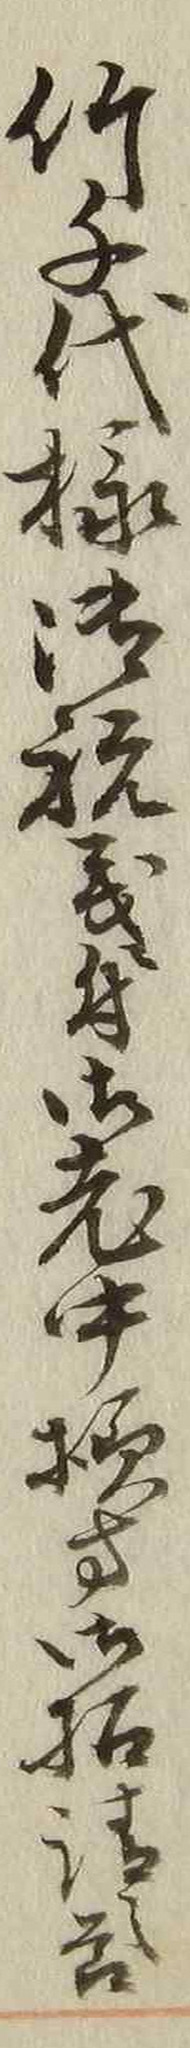竹千代様御祝義ニ付御老中様方御招請之節
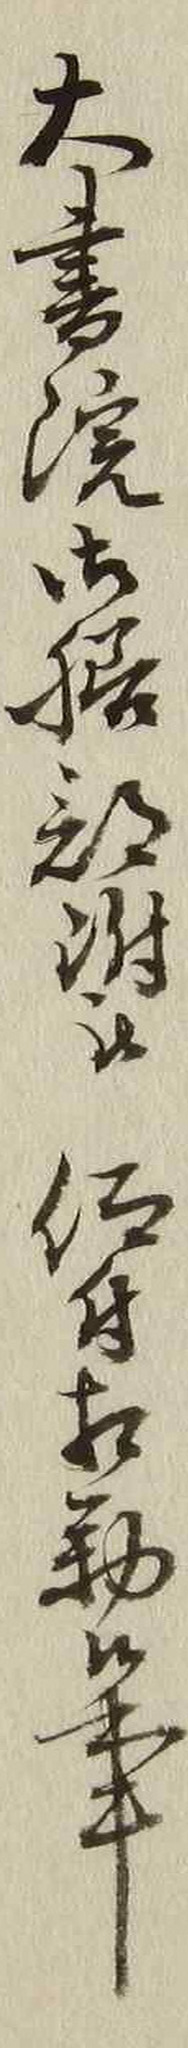大書院御膳部附被仰付相勤候事
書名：諸士系譜　巻之23　い之部23
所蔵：会津若松市立会津図書館
